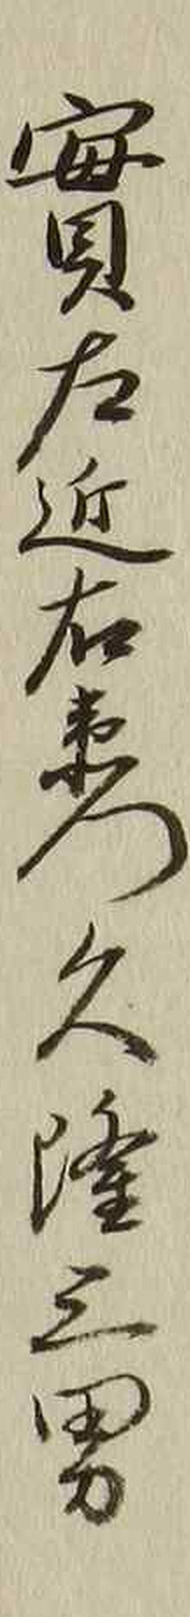実左近右衛門久隆三男
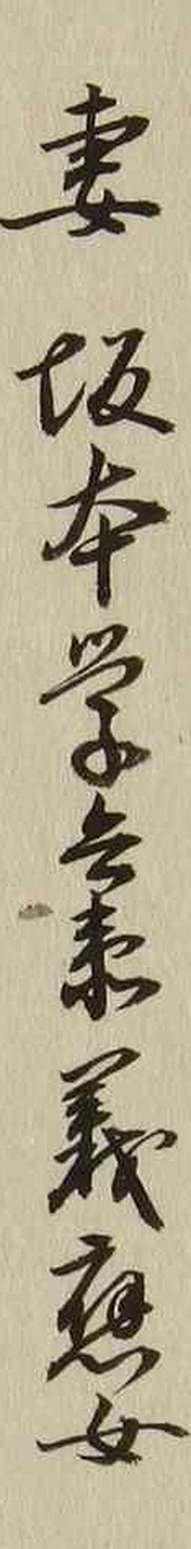妻坂本学兵衛義応女
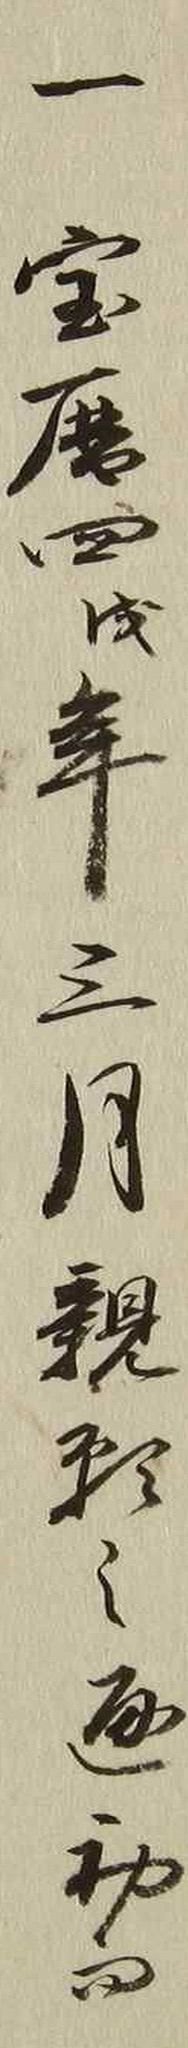一宝暦四戌年三月親願之通初而
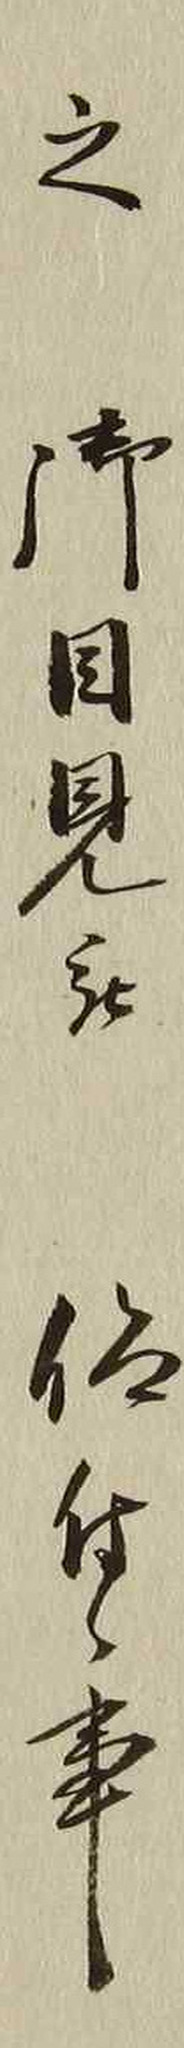之御目見被仰付候事
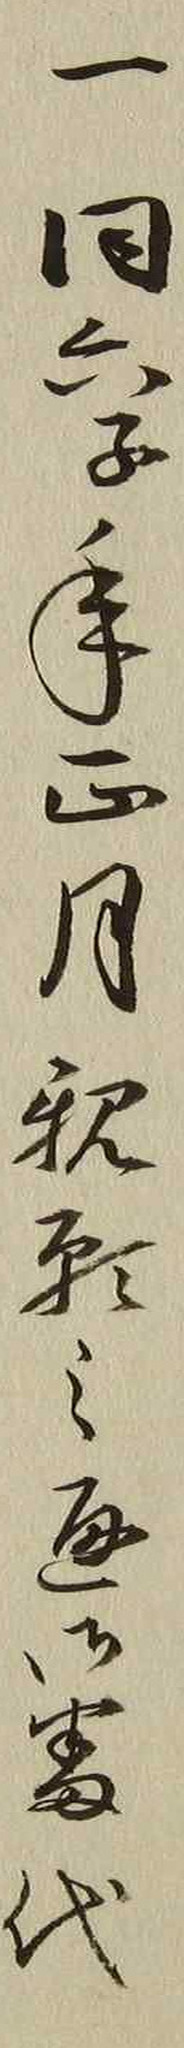一同六子年正月親願之通御番代
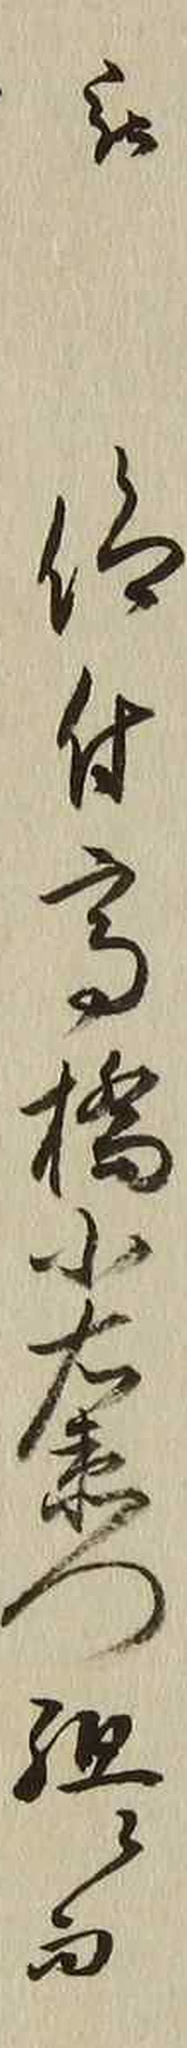被仰付高橋小右衛門組ニ而
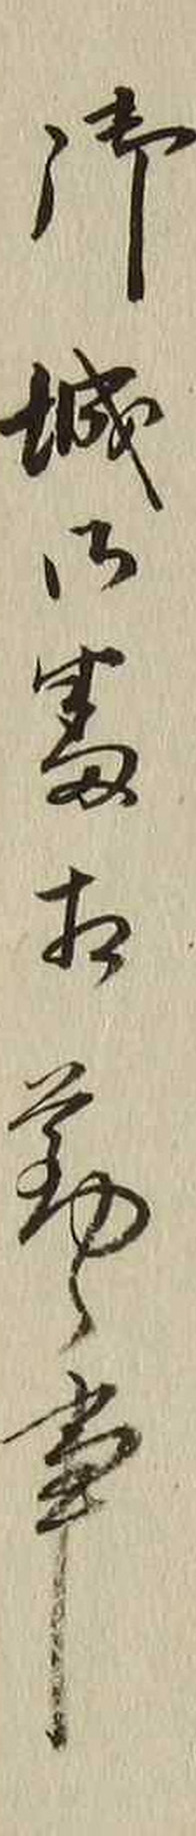御城御番相勤候事
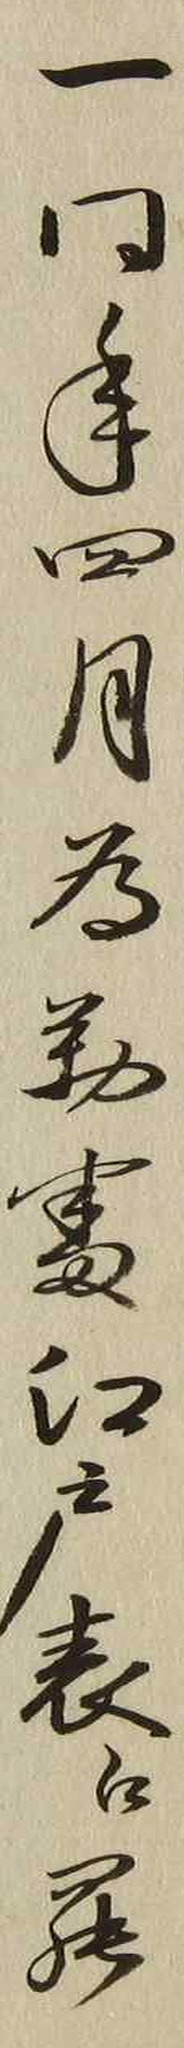一同年四月為勤番江戸表江罷
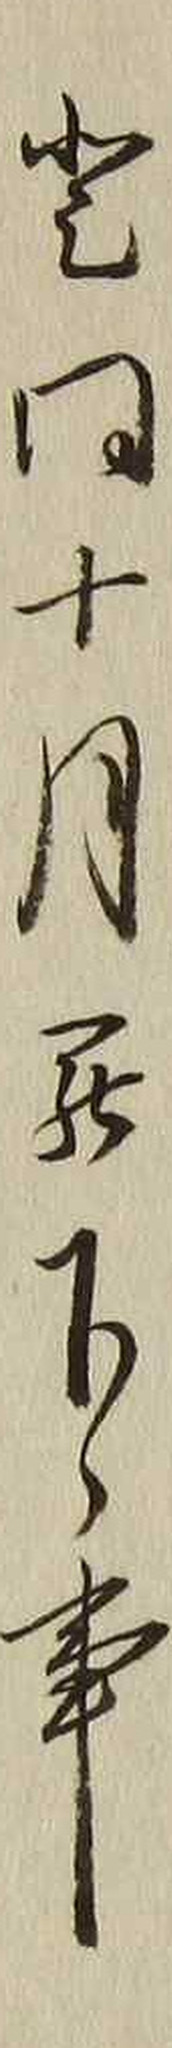登同十月罷下候事
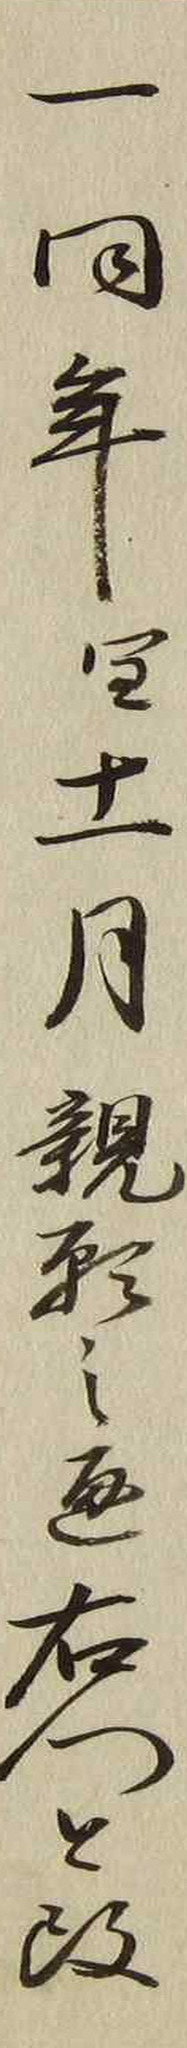一同年閏十一月親願之通右門と改
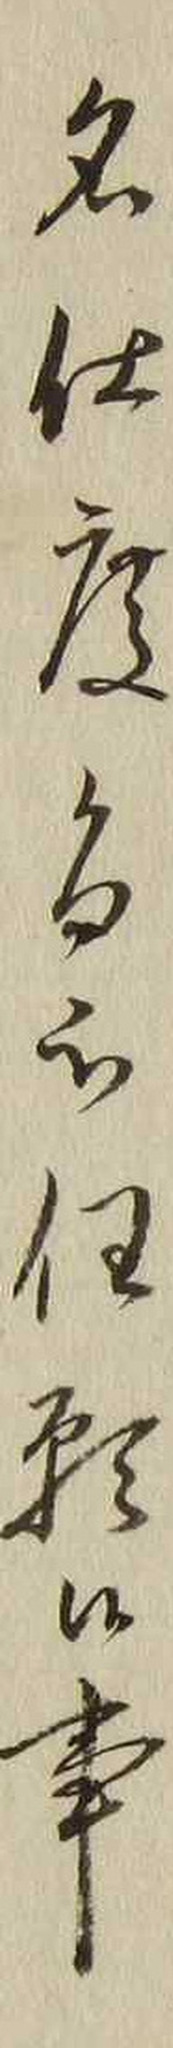名仕度旨被任願候事
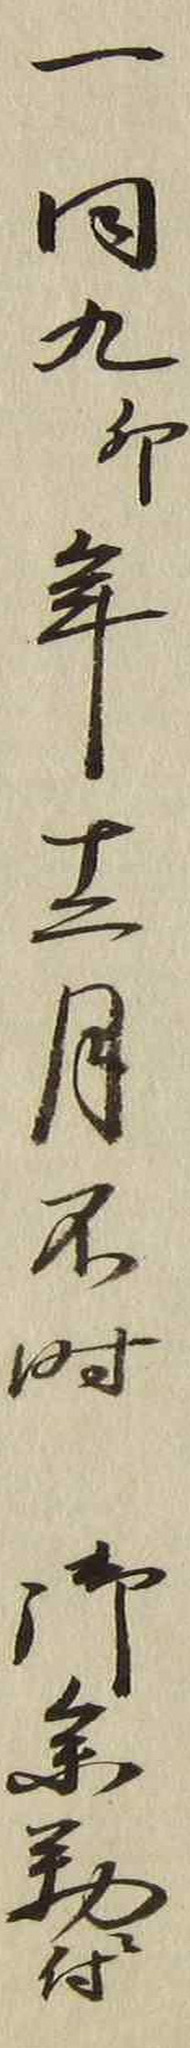一同九卯年十二月不時御参勤ニ付
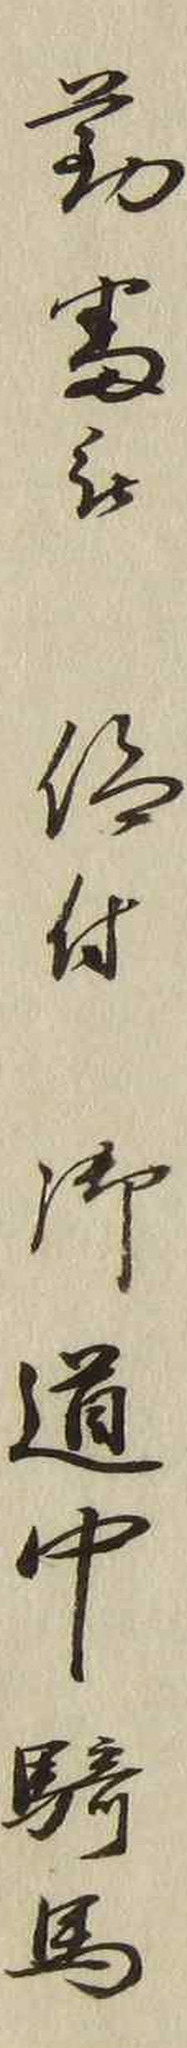勤番被仰付御道中騎馬
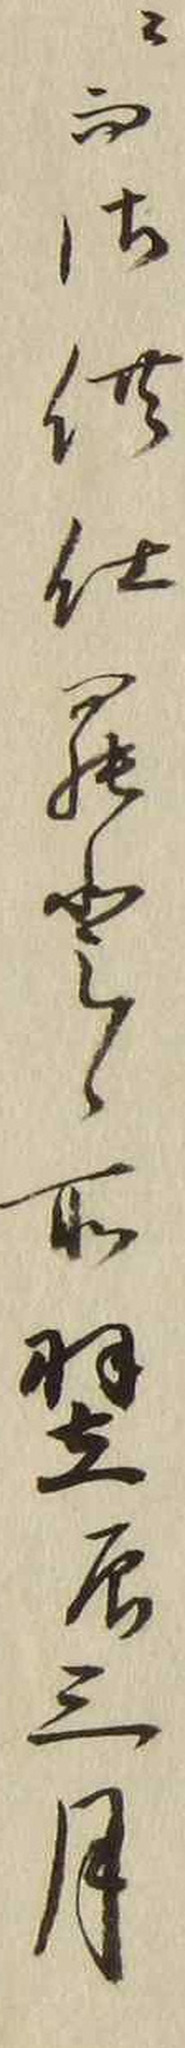ニ而御供仕罷登候所翌辰三月

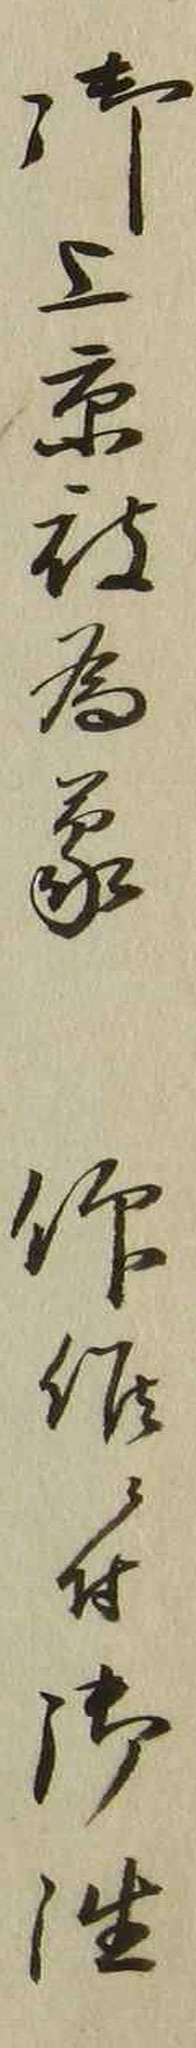御上京被為蒙仰候ニ付御往
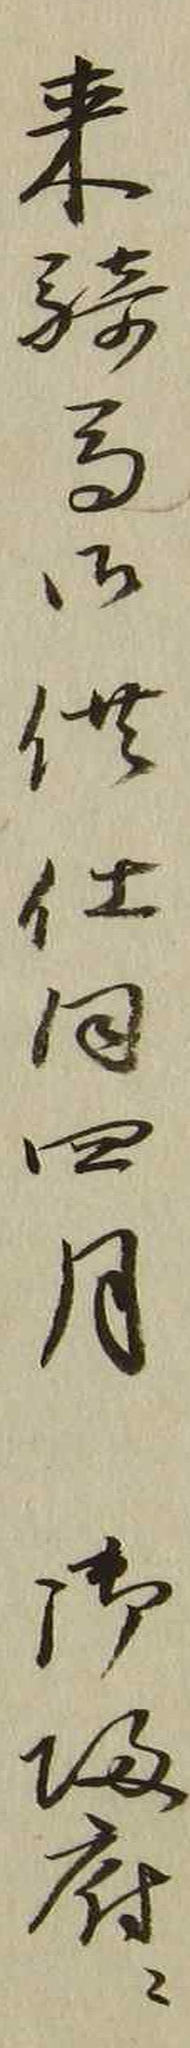来騎馬御供仕同四月御帰府ニ
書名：諸士系譜　巻之69　を之部3
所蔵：会津若松市立会津図書館
